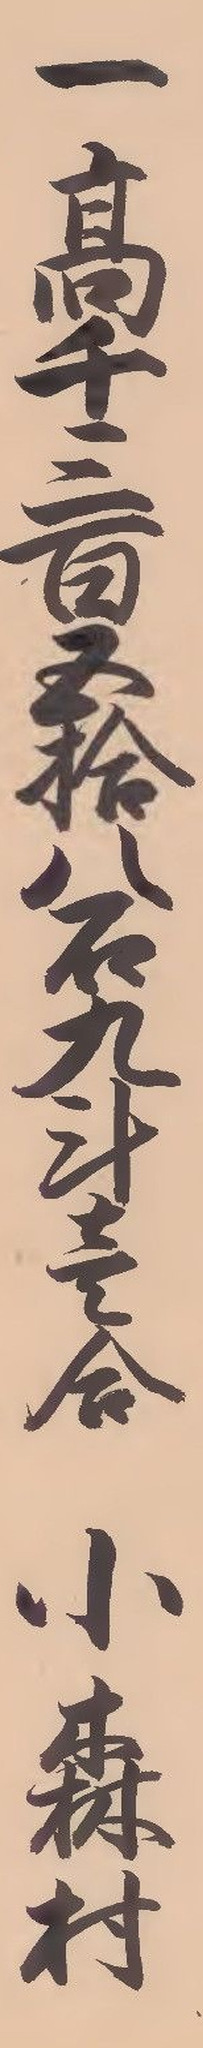一高千三百五拾八石九斗壱合小森村

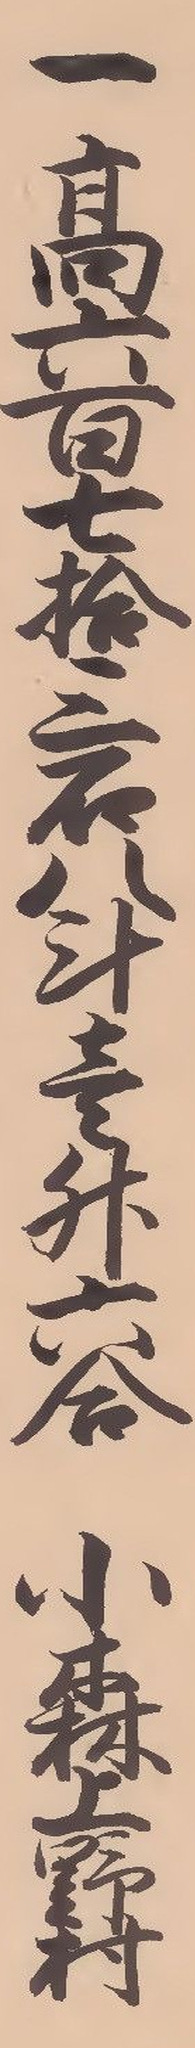一高六百七拾三石八斗壱升六合小森上野村
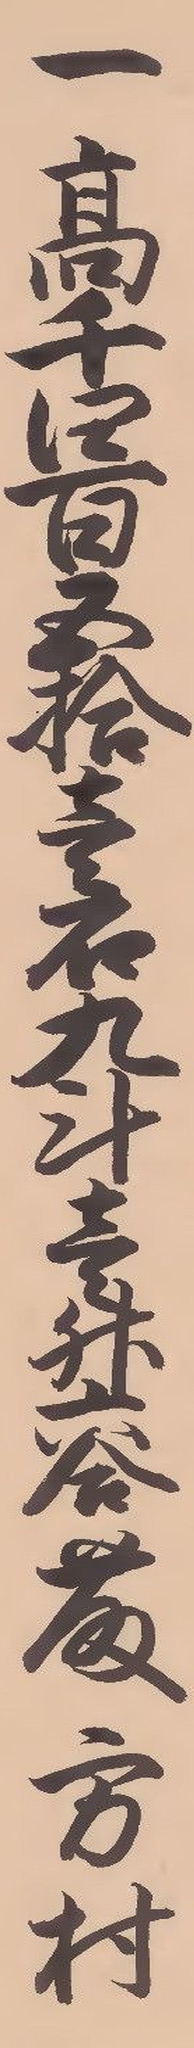一高千四百五拾壱石九斗壱升六合藤方村
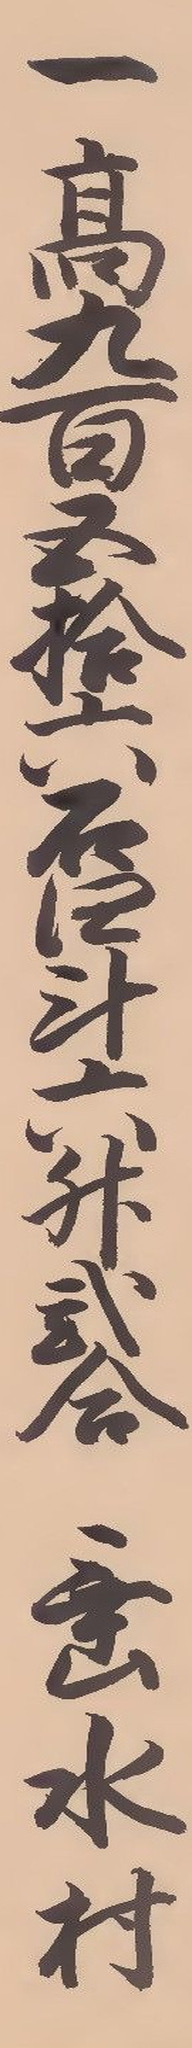一高九百五拾六石四斗六升弐合垂水村
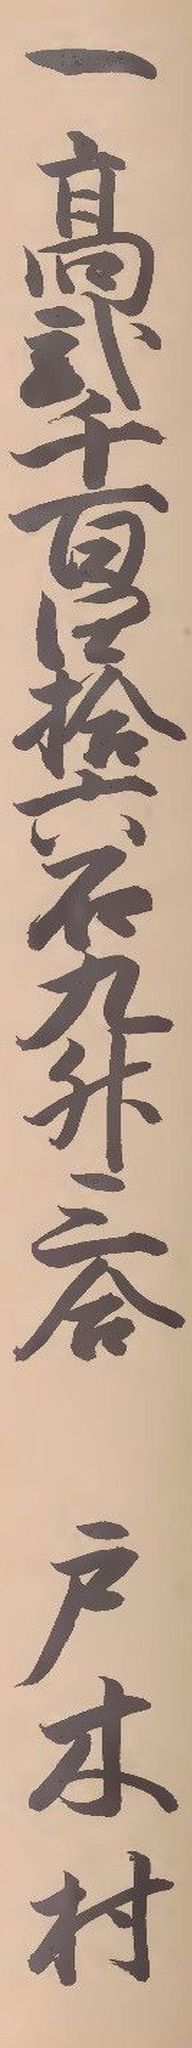一高弐千百四拾六石九升三合戸木村
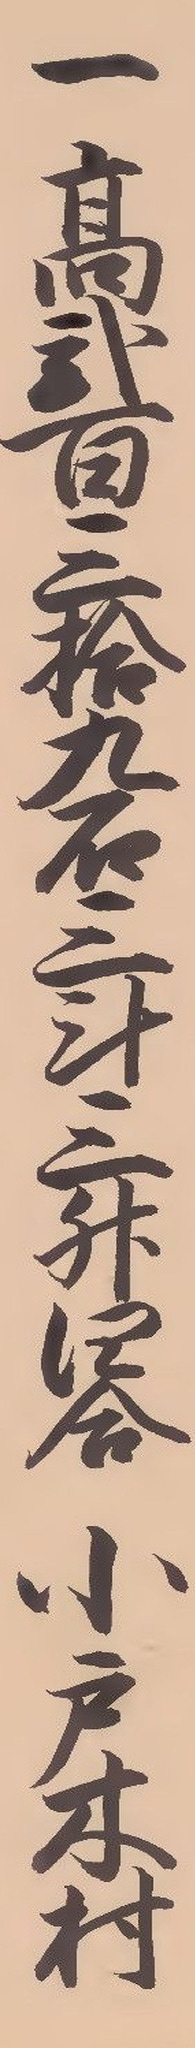一高弐百三拾九石三斗三升四合小戸木村
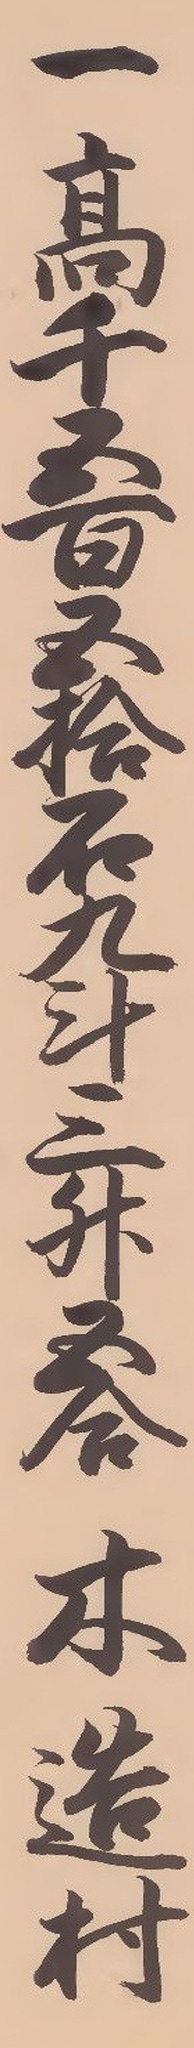一高千五百五拾石九斗三升五合木造村
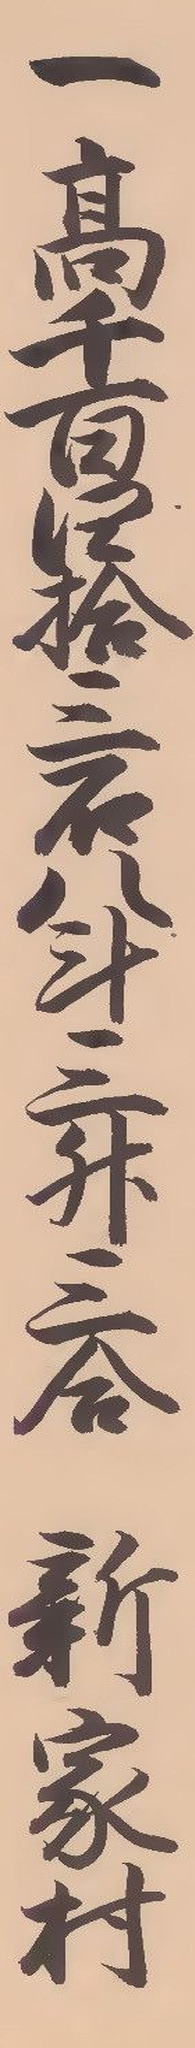一高千百四拾三石八斗三升三合新家村

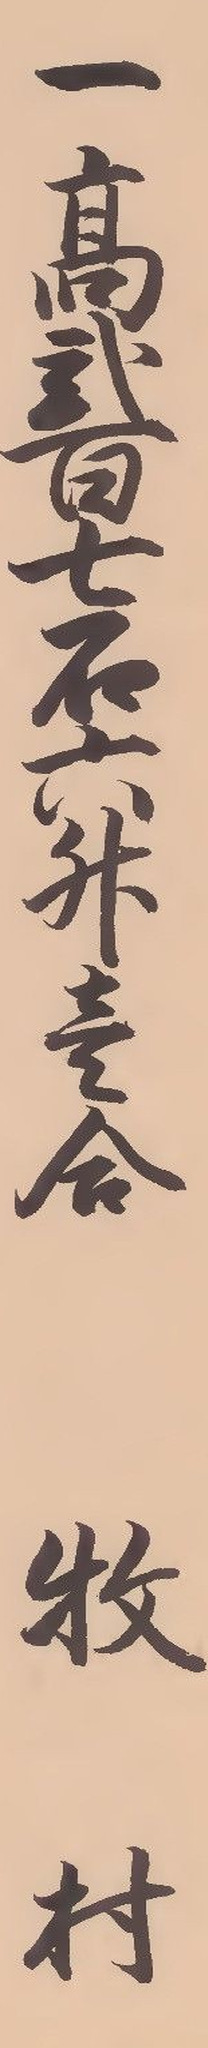一高弐百七石六升壱合牧村
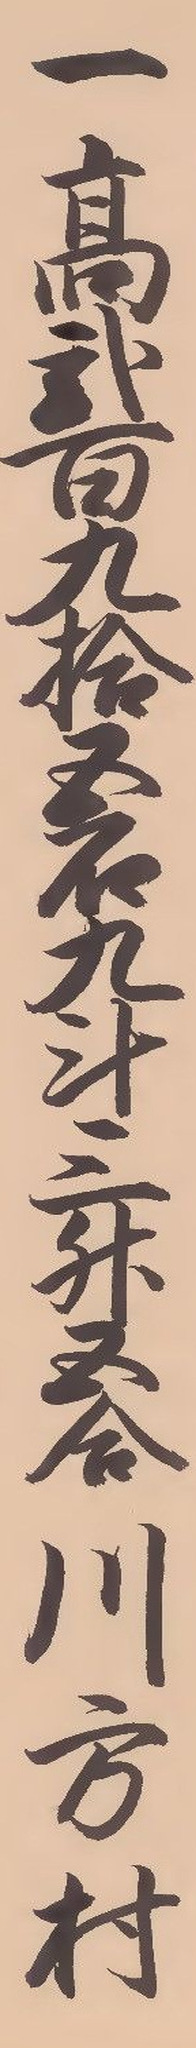一高弐百九拾五石九斗三升五合川方村
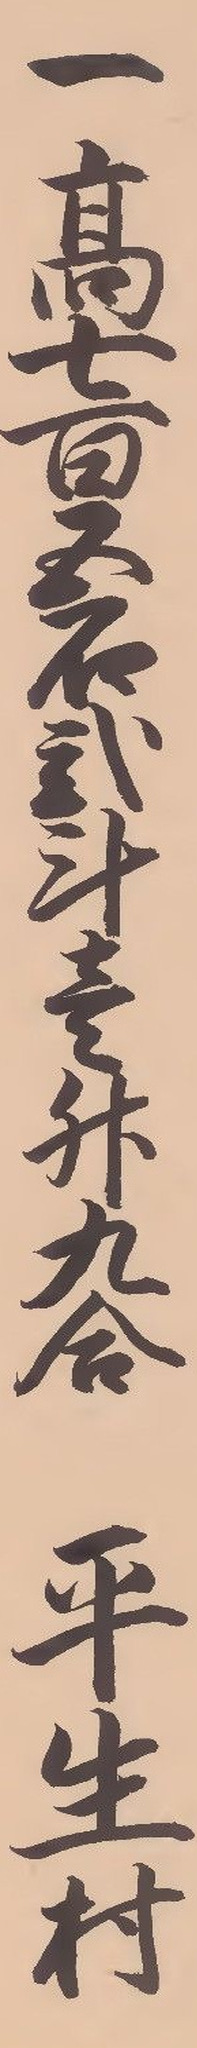一高七百五石弐斗壱升九合平生村
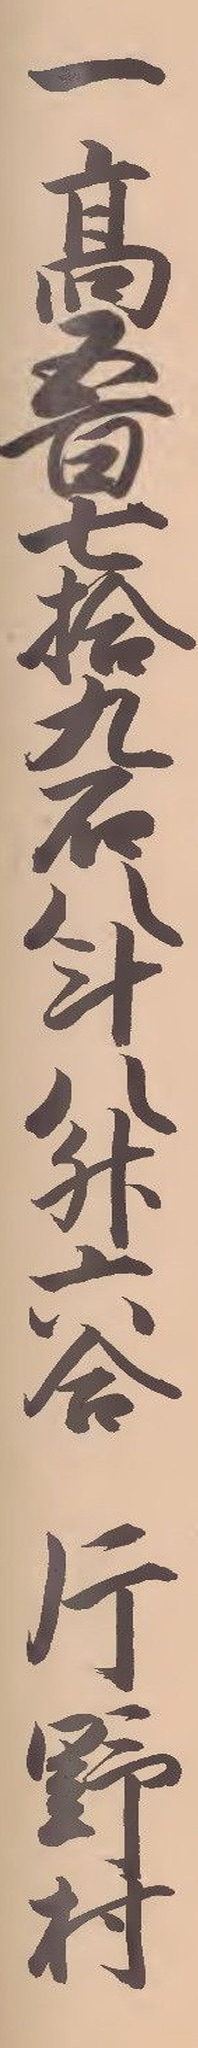一高五百七拾九石八斗八升六合片野村
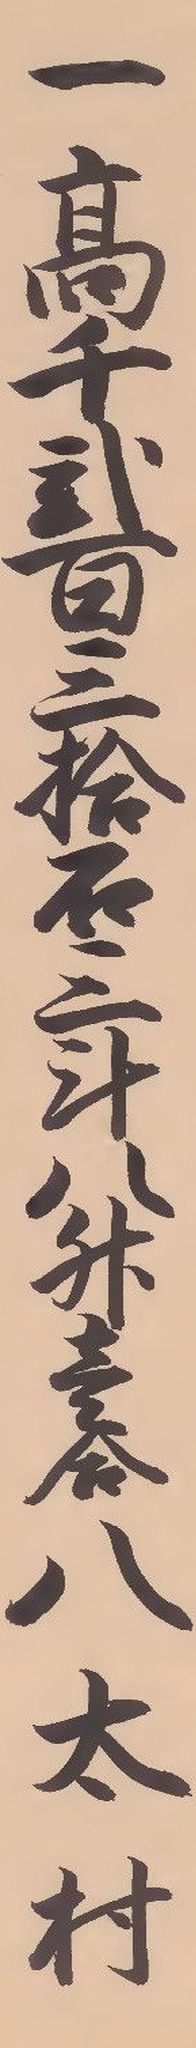一高千弐百三拾石三斗八升壱合八太村
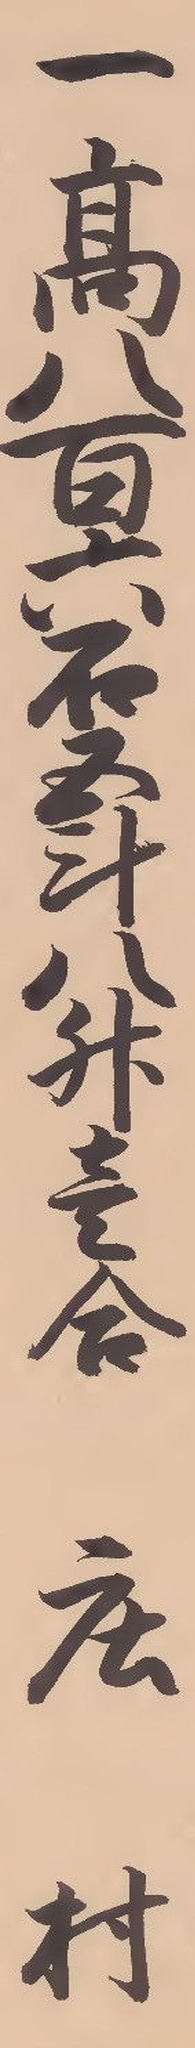一高八百六石五斗八升壱合庄村
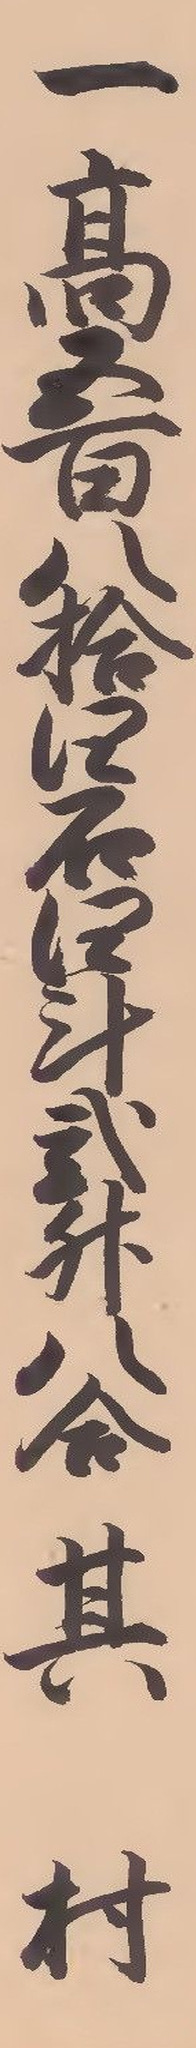一高五百八拾四石四斗弐升八合其村

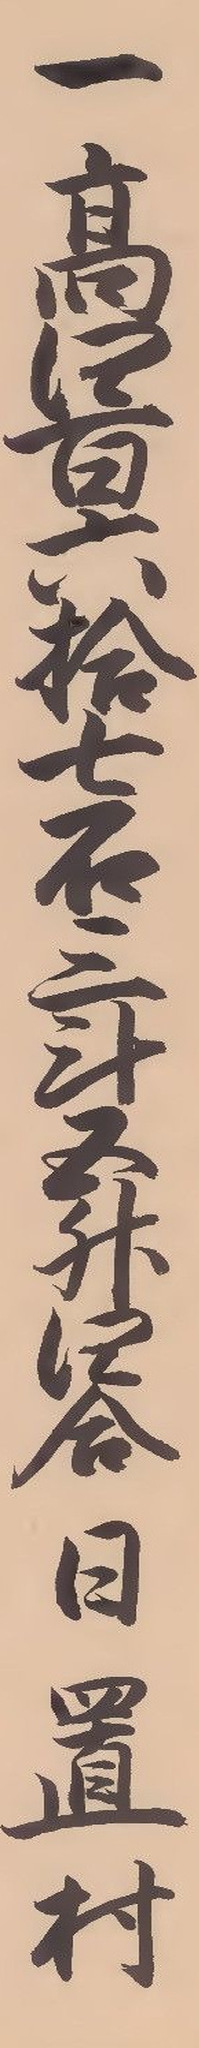一高四百六拾七石三斗五升四合日置村
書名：伊勢国郷帳
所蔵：国立公文書館 National Archives of Japan
